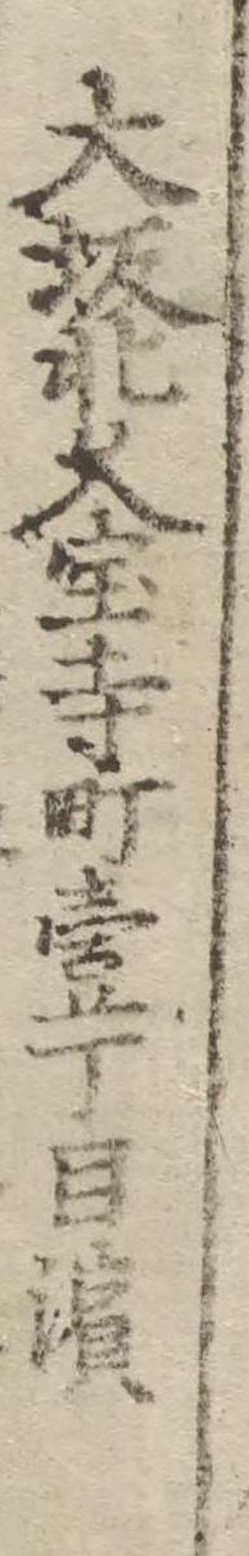大坂北久宝寺町壱丁目濱
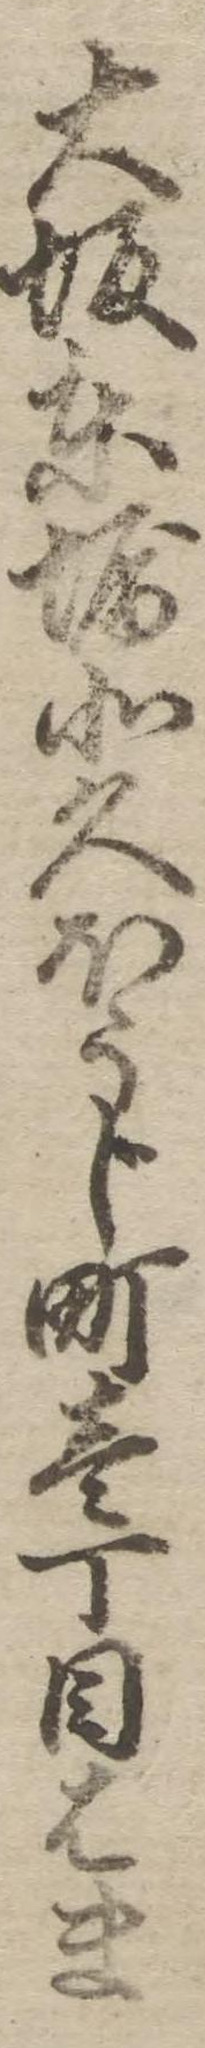大坂東堀北久ほうじ町壱丁目はま
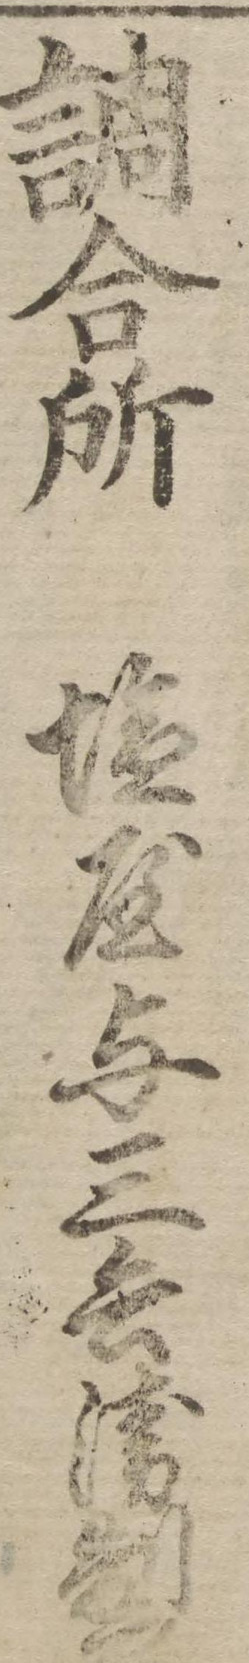調合所塩屋与三兵衛製

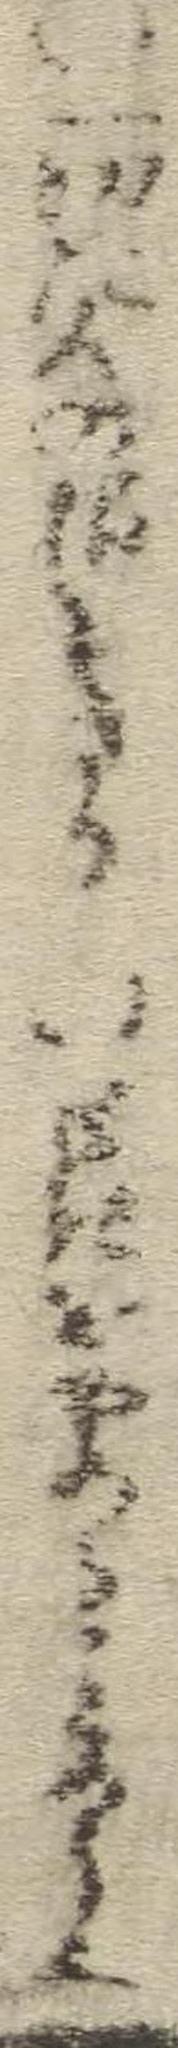〇一切たんの根をきり○せきをやめることめう也
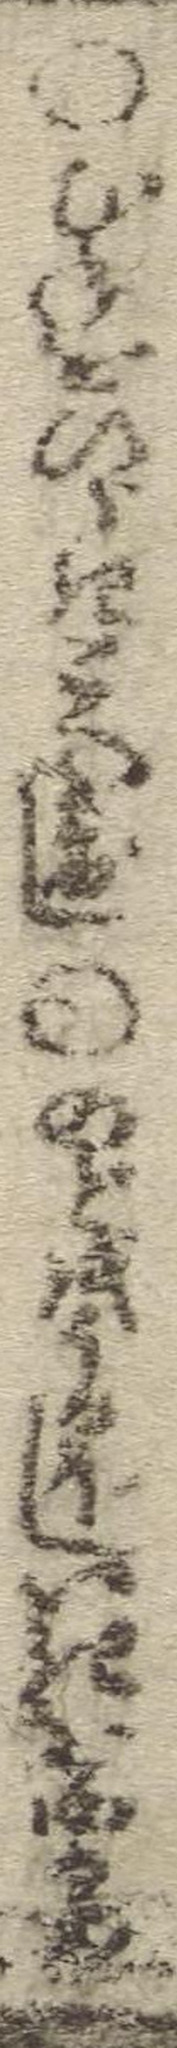〇むねをひらきこへをまし〇のどをうるほしいきをゆるめ
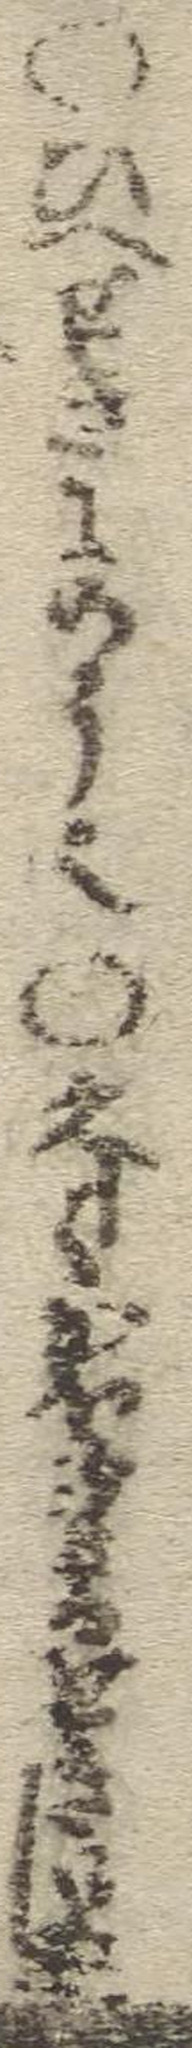〇ひへせきにめう也〇久しくほせきによし
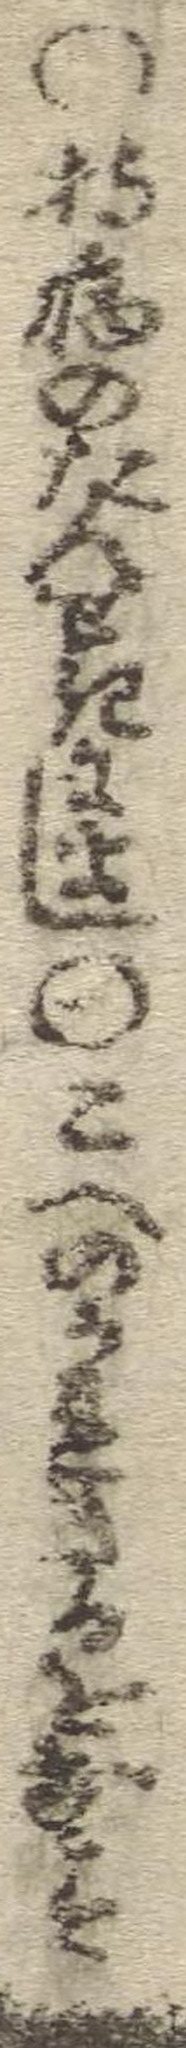〇持病のたんせきによし〇こへのかれたるを出す
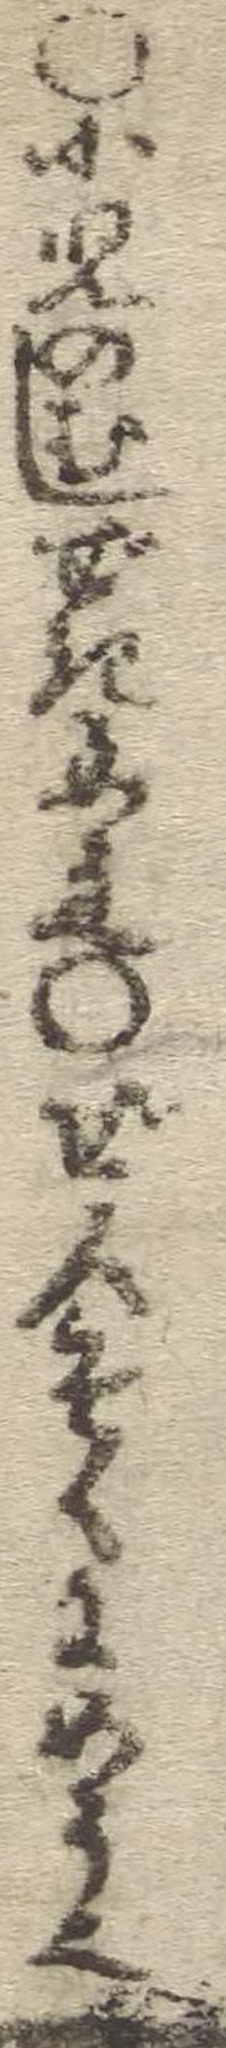〇小児のむしぜきニめう也〇ぜんそくにめう也
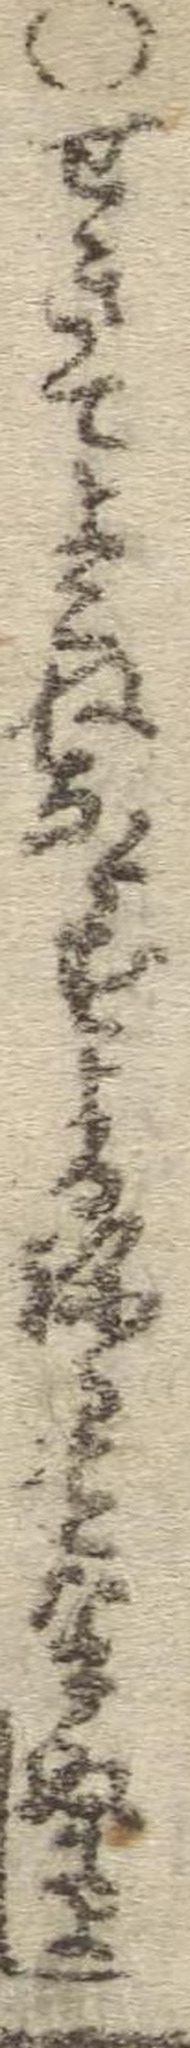〇せきてよこねならずよるねることならぬによし
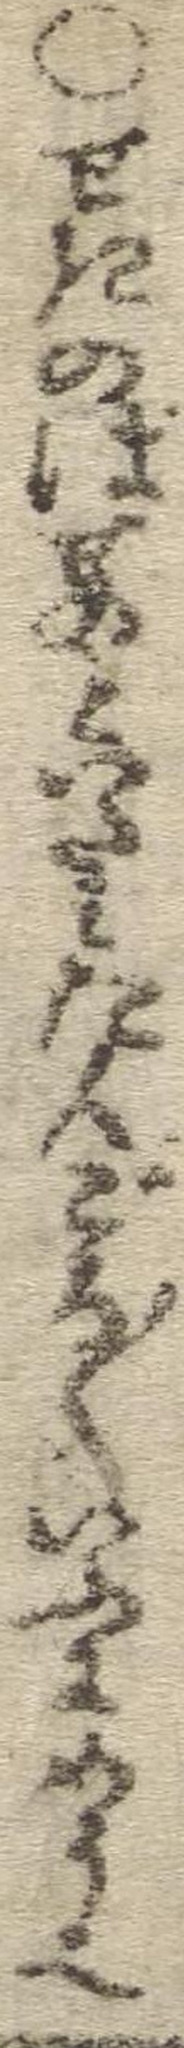〇せきのぼせのといたみたんごろ〳〵いふにめう也
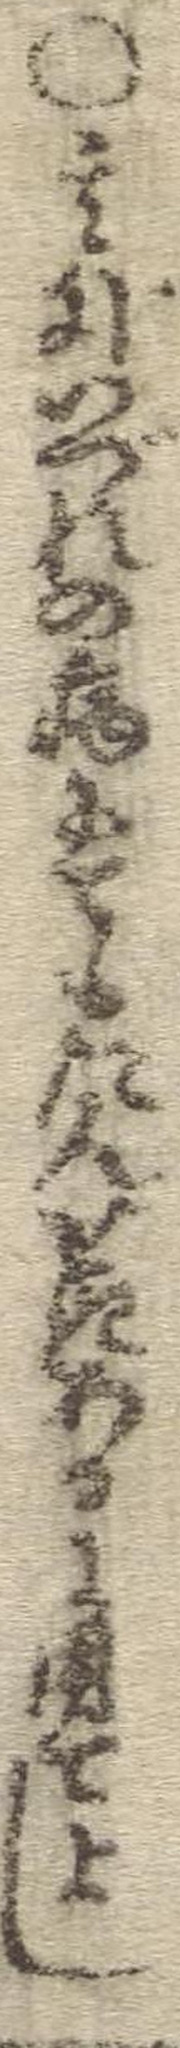〇其外いづれの病にてもたんせきあるに用てよし
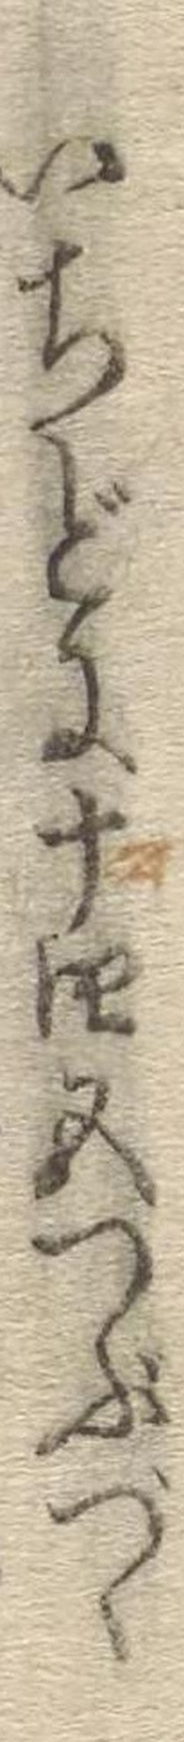いちどに十四五つぶつゝ
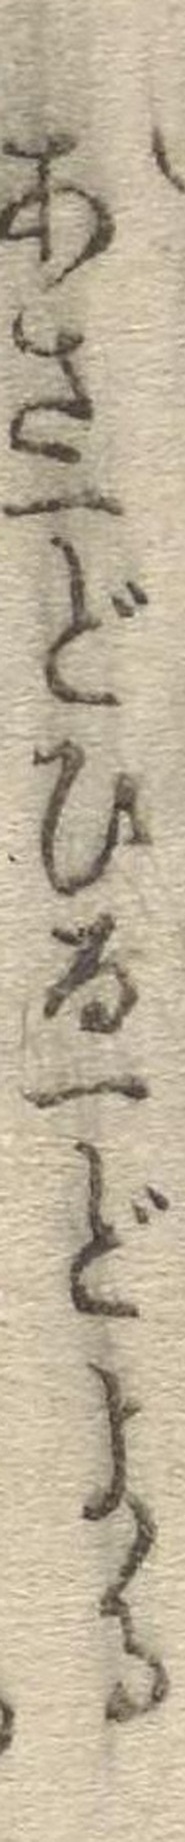あさ一どひる一どよる
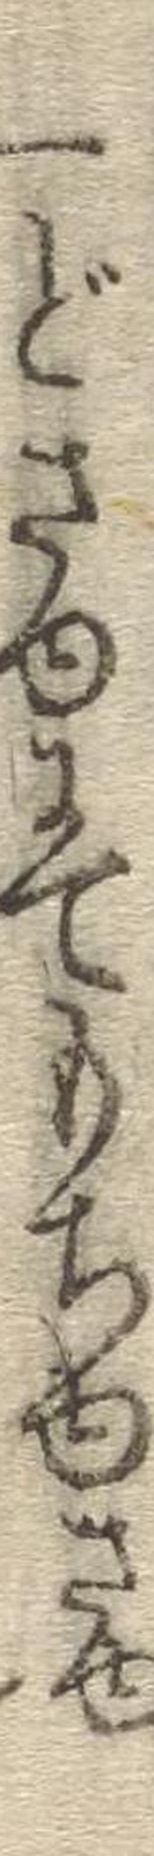一どさゆにてもちゆさゆ
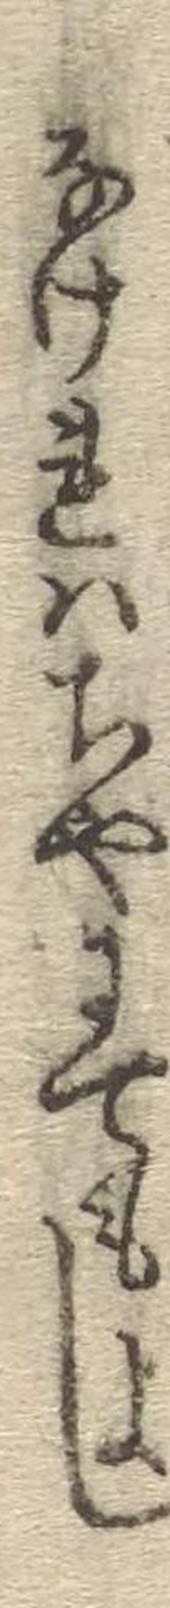なければちやにてもよし
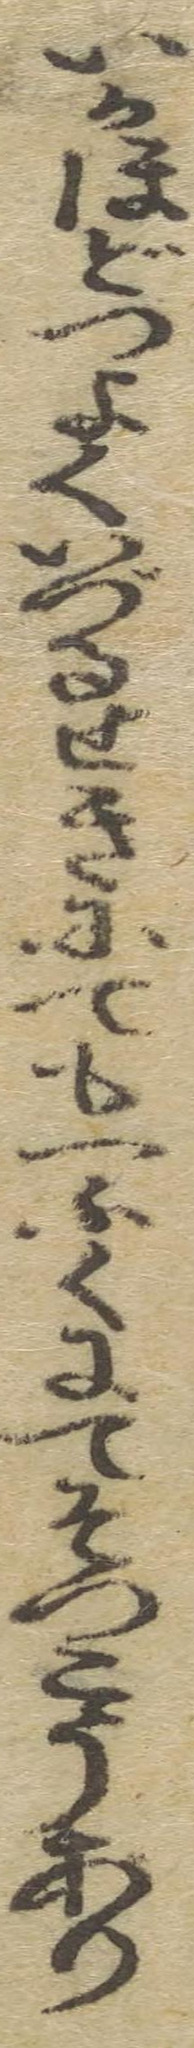いかほどつよくいづるせきにても一ふくにてそつこうあり
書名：浪華薬種問屋能書張交帖. 二
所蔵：国立国会図書館 National Diet Library, JAPAN
